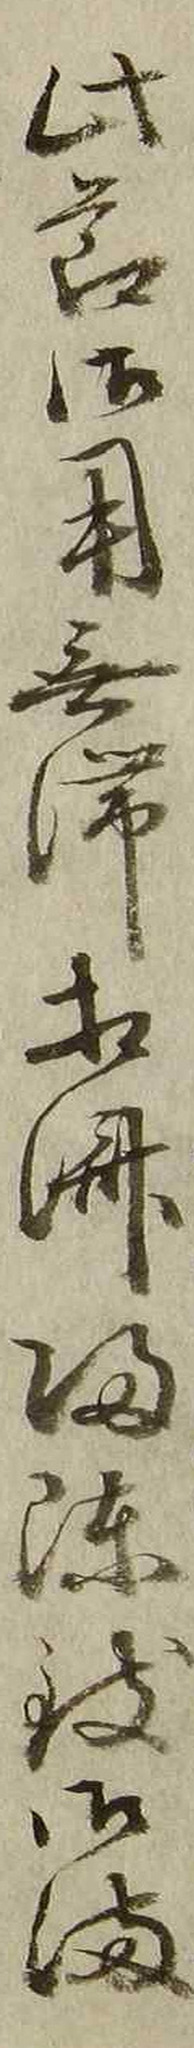此節御用無滞相済帰陳致御満
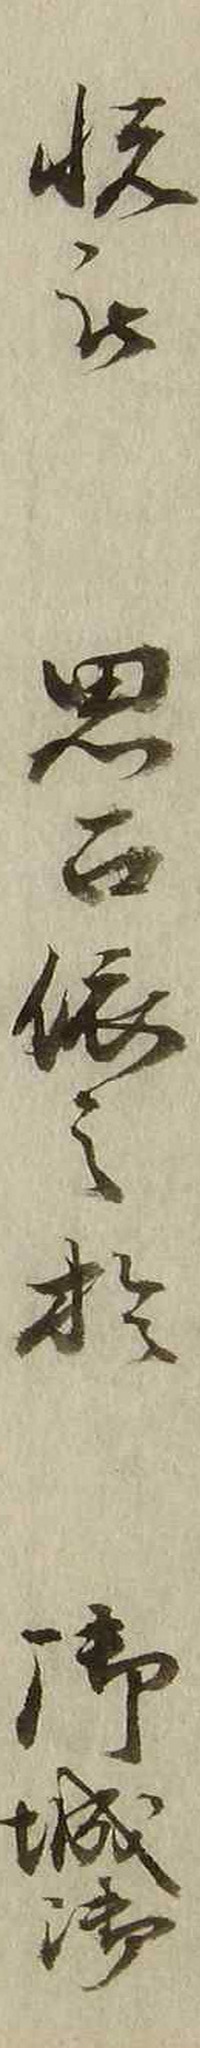悦被思召依之於御城御
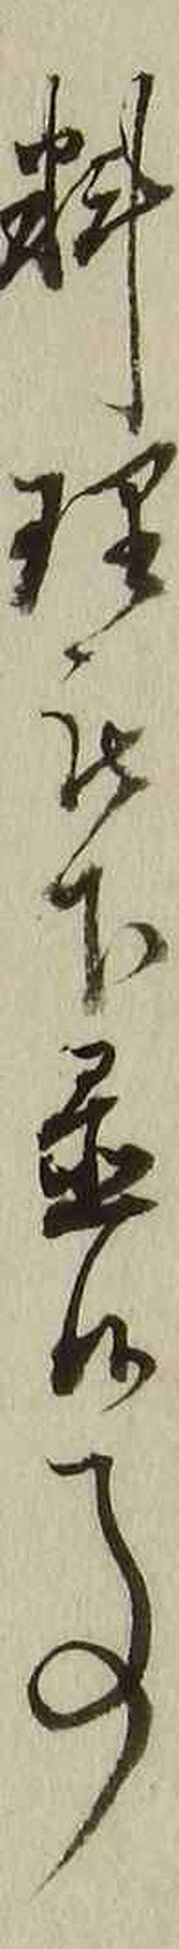料理被下置候事
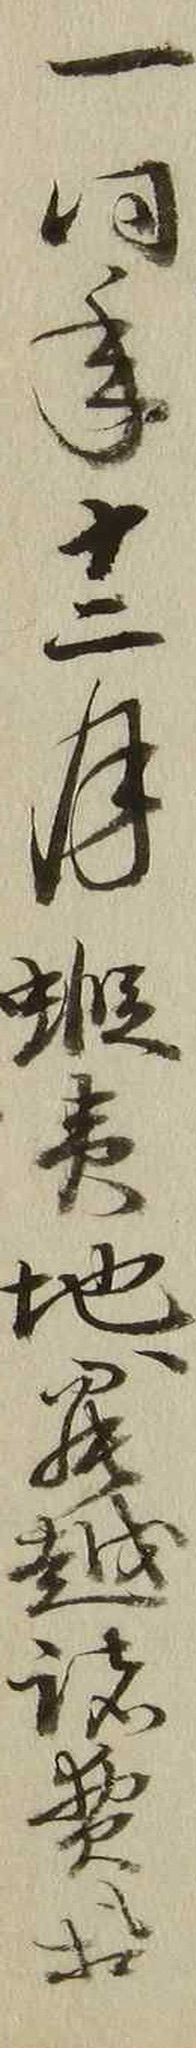一同年十二月蝦夷地へ罷越諸費も相
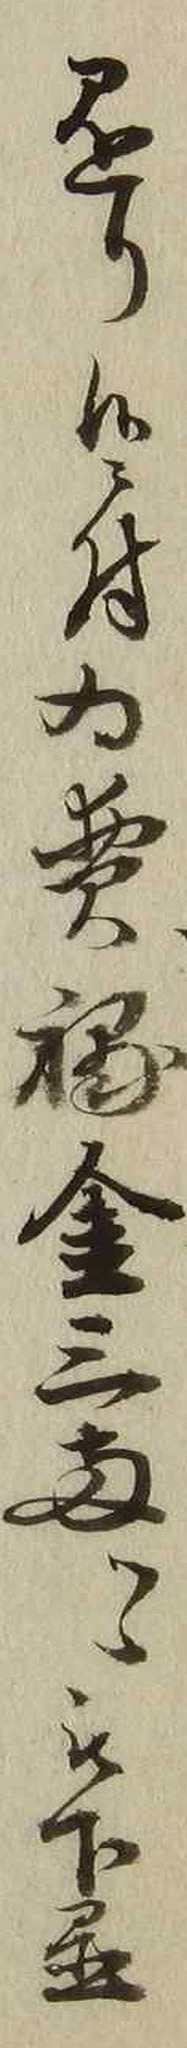懸り候ニ付為費補金三両ツヽ被下置
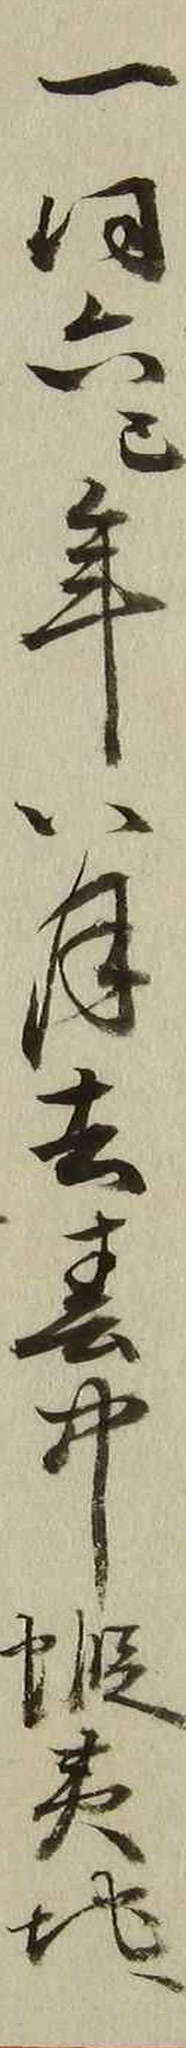一同六巳年八月去春中暇夷地へ
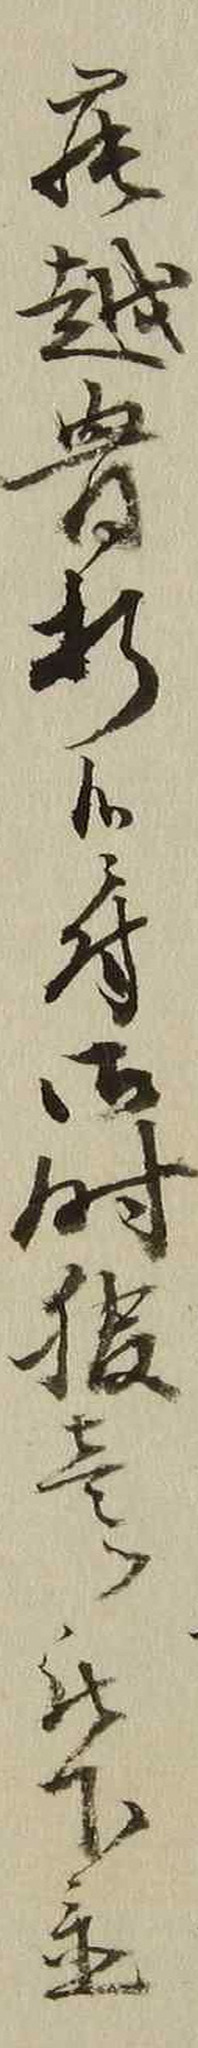罷越骨折候ニ付御時服壱ツ被下置
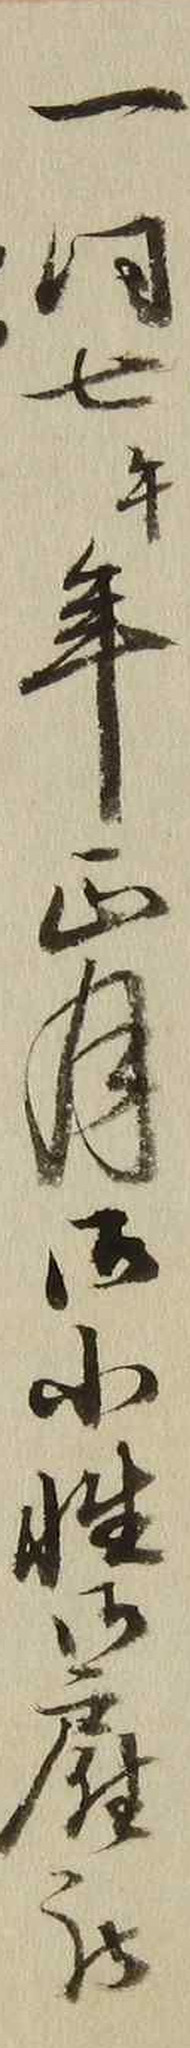一同七午年正月御小性御雇被
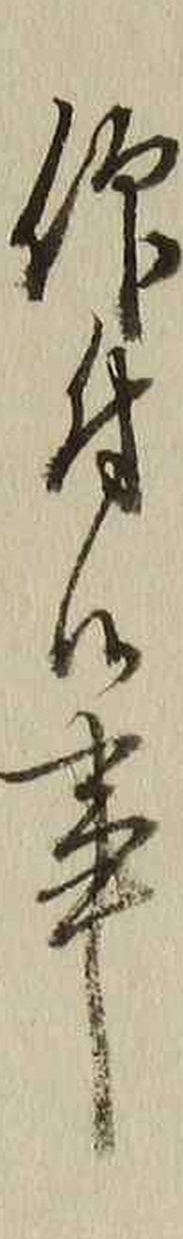仰付候事
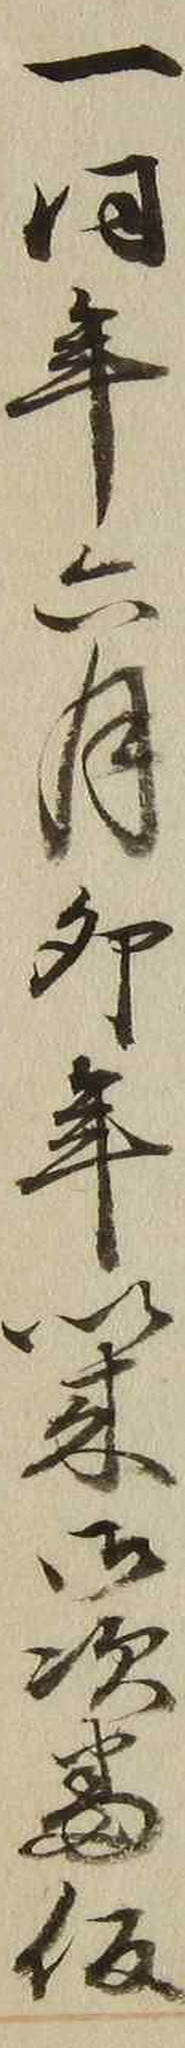一同年六月卯年以来御次番仮
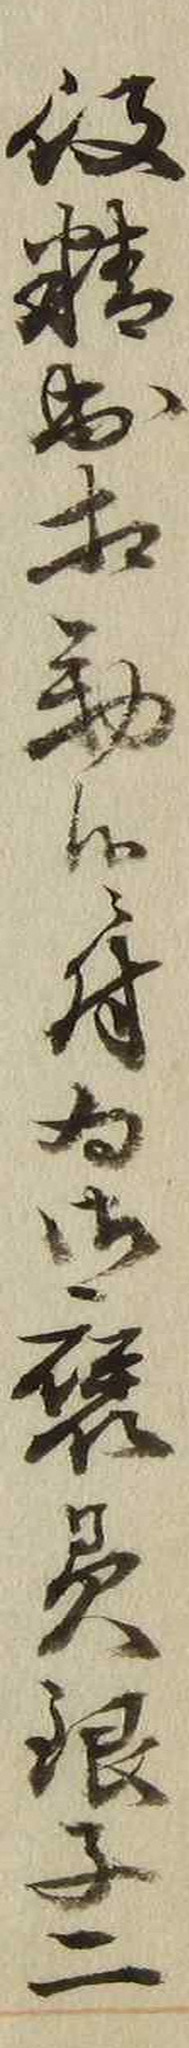役精出相勤候ニ付為御褒美銀子二
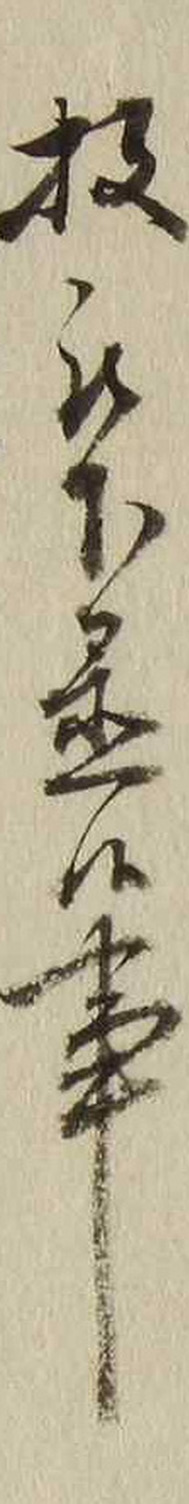枚被下置候事
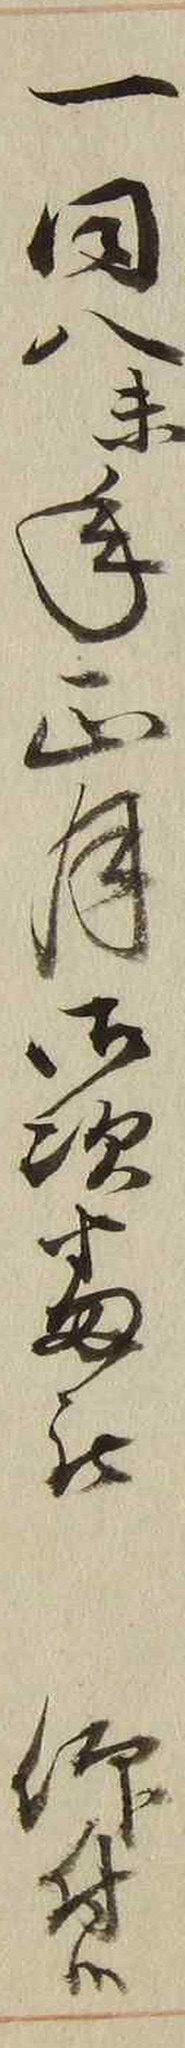一同八未年正月御次番被仰付候
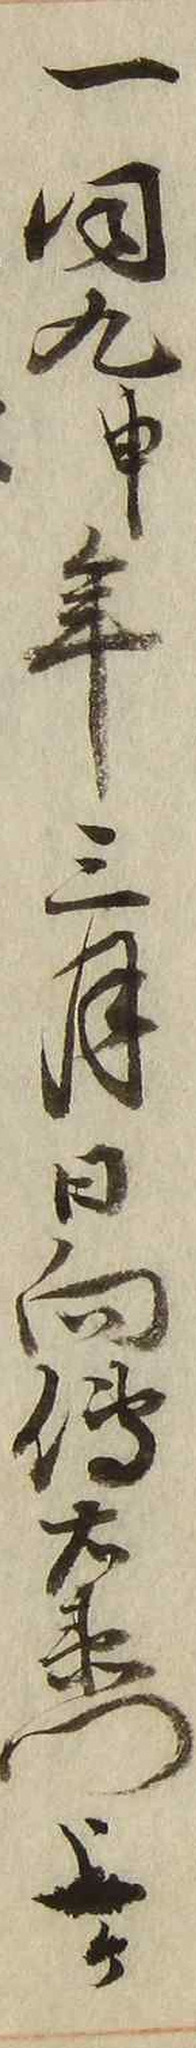一同九申年三月日向伝右衛門上ヶ
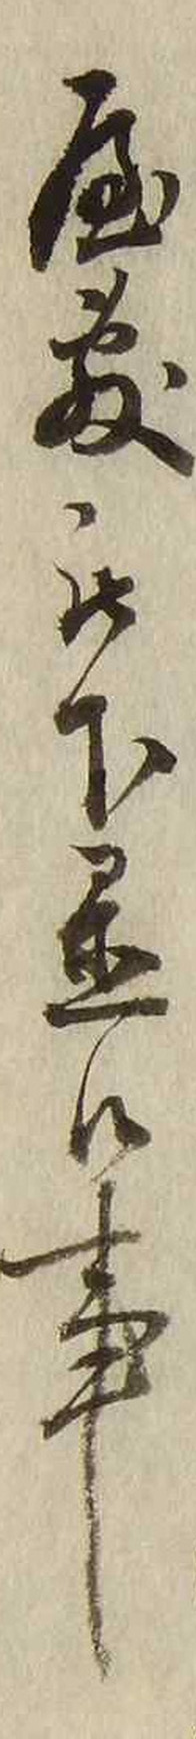屋敷被下置候事

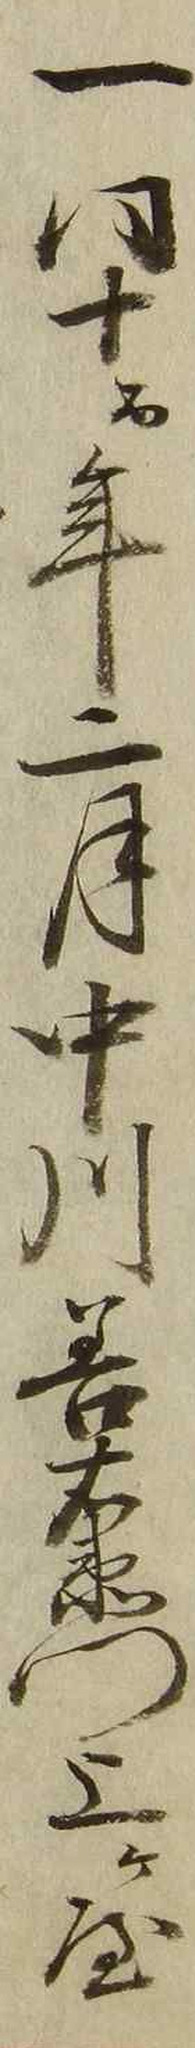一同十酉年二月中川善右衛門上ヶ屋
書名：諸士系譜　巻之36　は之部4
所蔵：会津若松市立会津図書館
